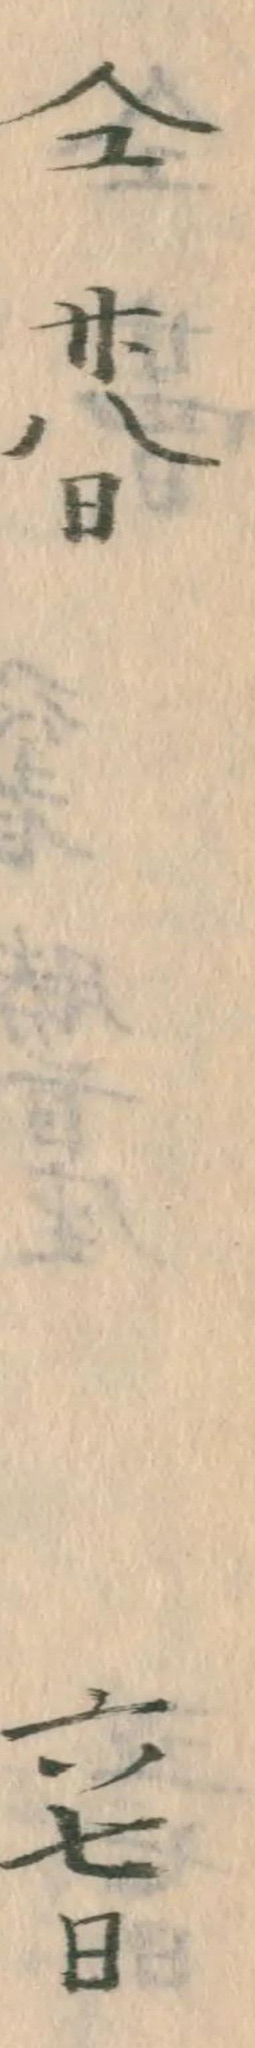同廿八日六七日
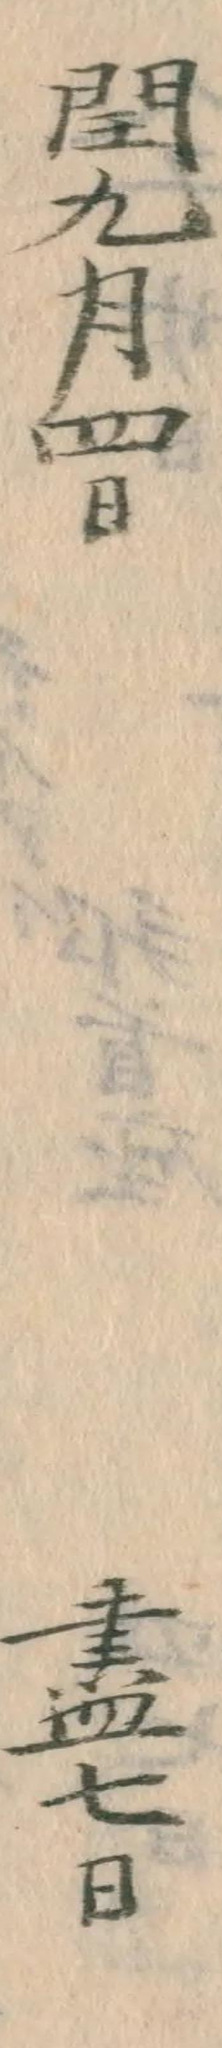閏九月四日盡七日
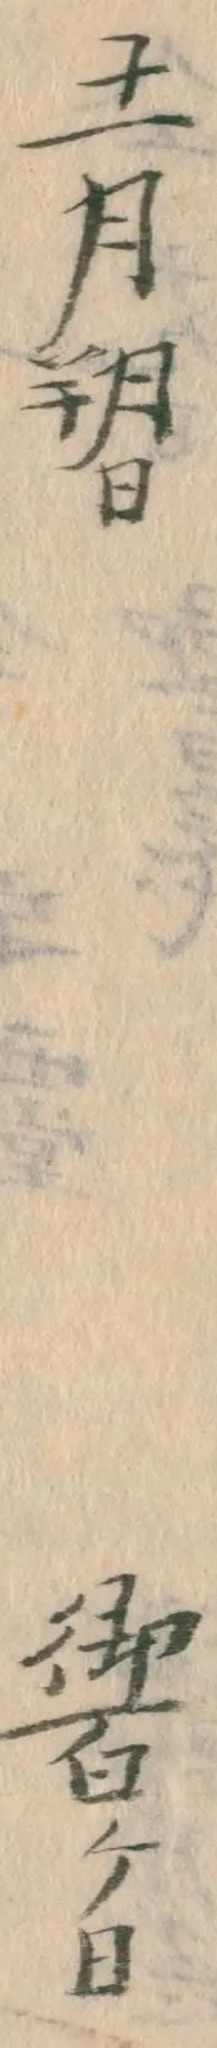十一月朔日御百ケ日
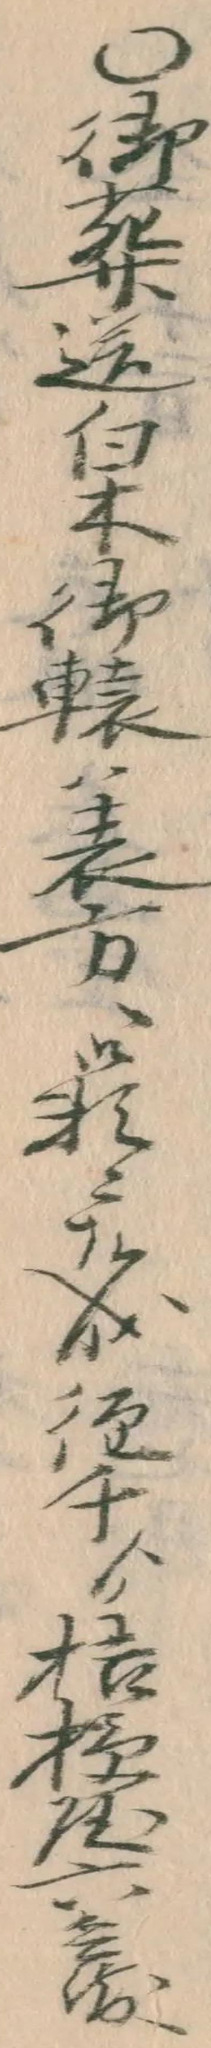○御葬送白木御轅ハ表方へ候頼ニ相成経千ゟ桔梗屋六兵衛へ
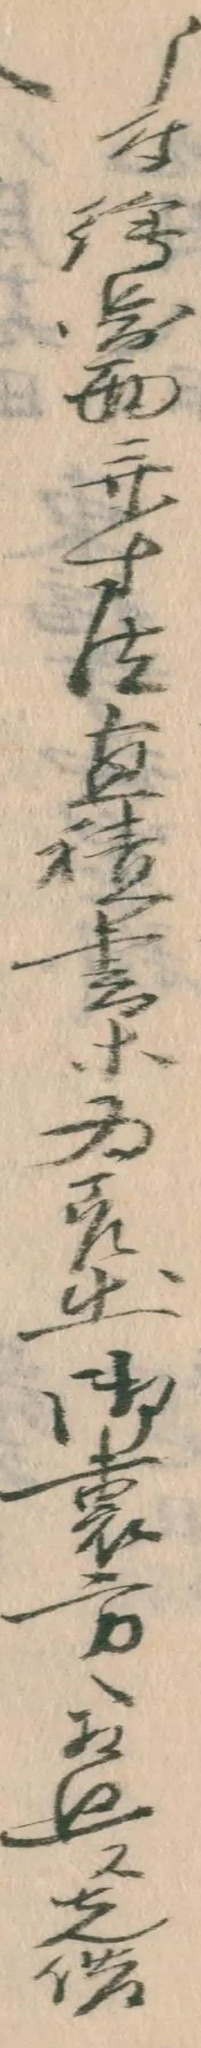申付絵圖面幷寸法直積書等為差出御裏方へ相廻ス先借
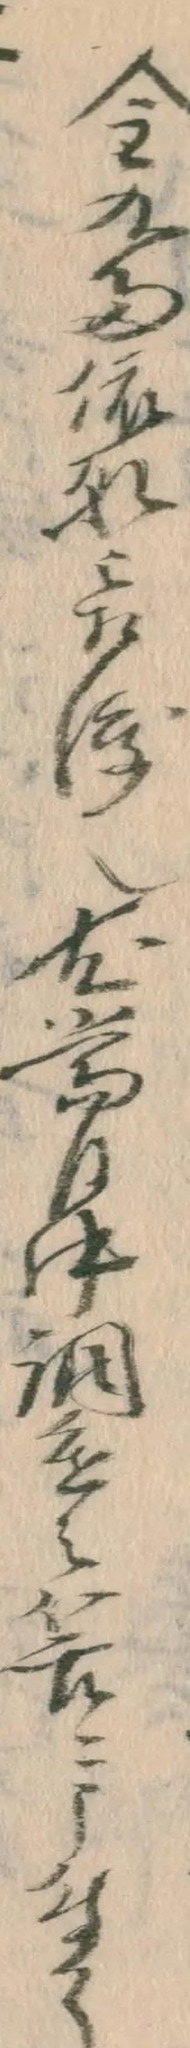金九両依願被相渡也尤當月中調進之筈ニ申付了
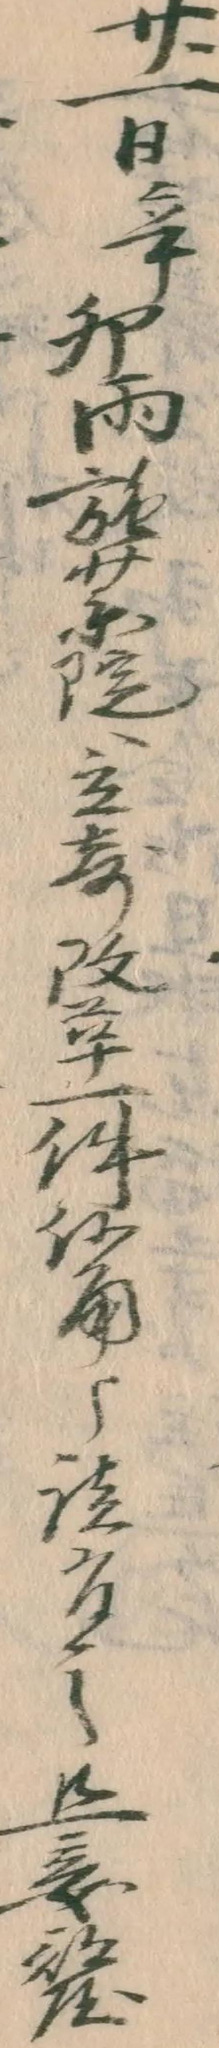廿一日辛卯雨施薬院へ立寄改革一件何角申談有之且妾部屋
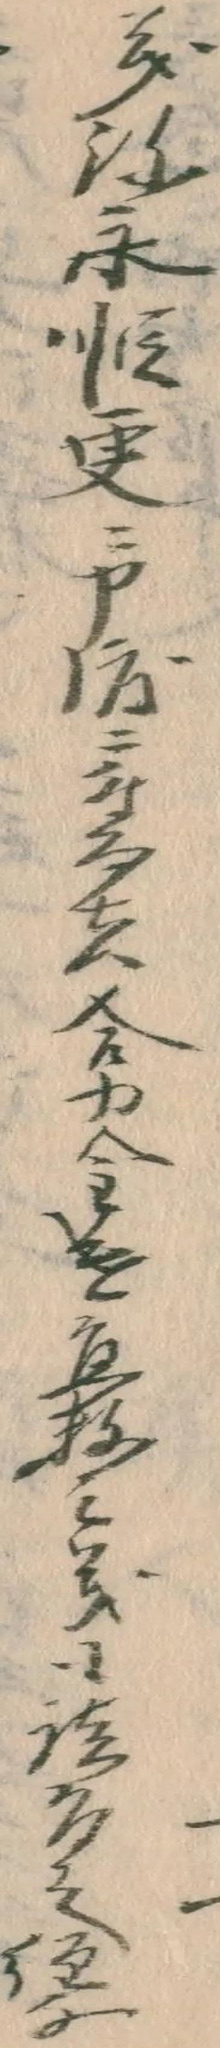義弥永暇更ニ申渡ニ付而者合力金遣直数之義も談有之経千
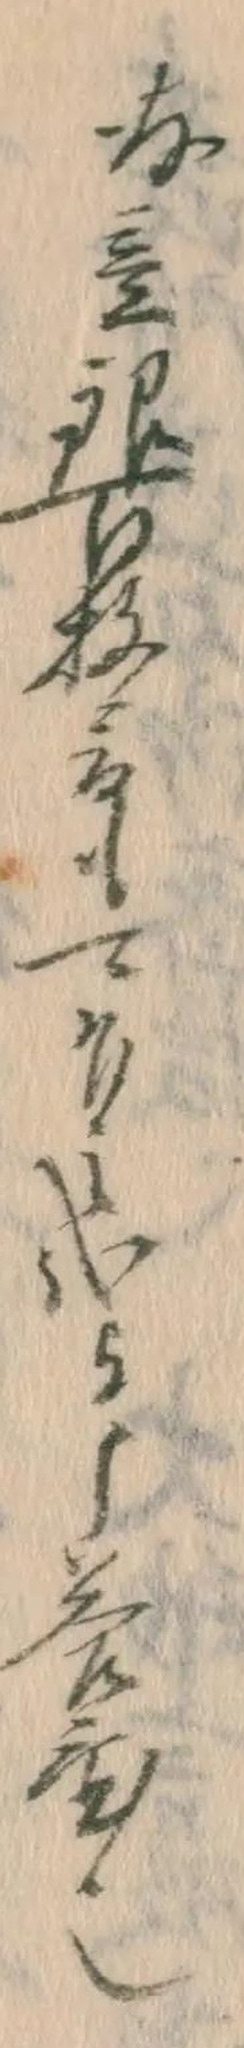存置銀百枚ニ而も可有之哉と申答置也
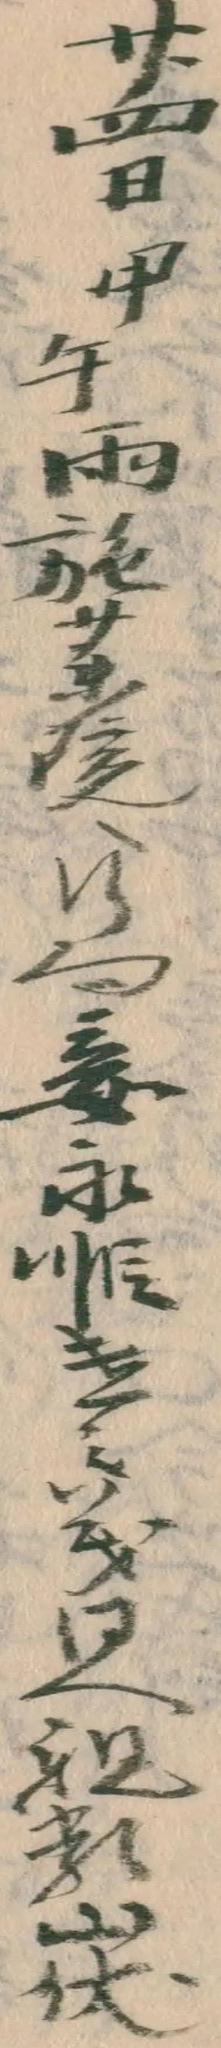廿四日甲午雨施薬院へ行向妾永暇遣之義同人親類山伏
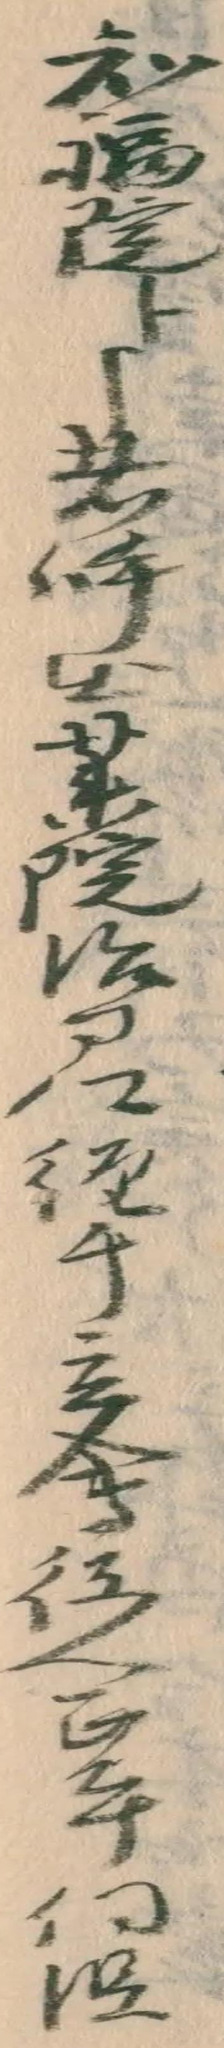知福院と申者呼出薬院治部卿経千立會役人正平伺役
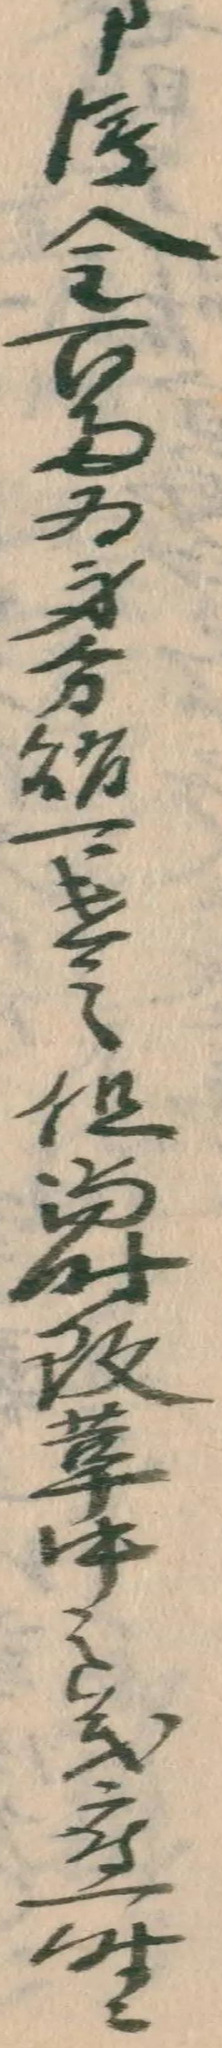申渡金百両為身分賄可遣之但當時改革中之義ニ付一時ニ
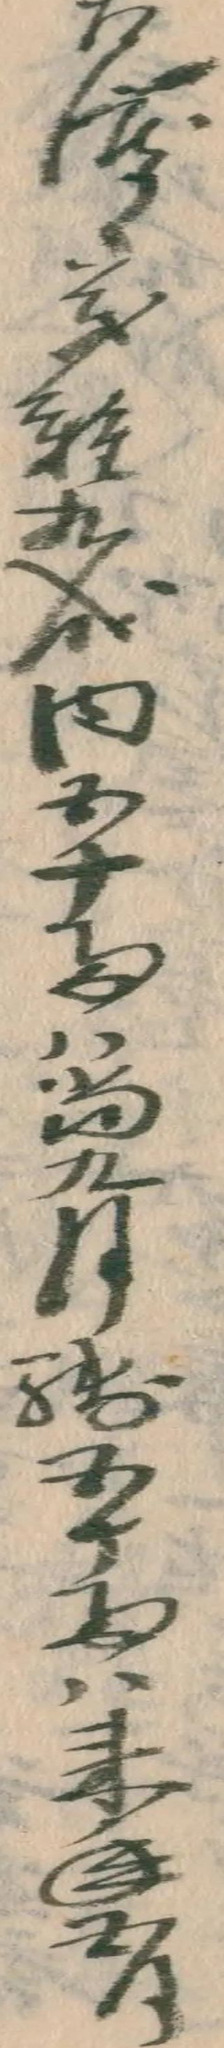相渡候義難相成内五十両ハ當九月残五十両ハ来年五月
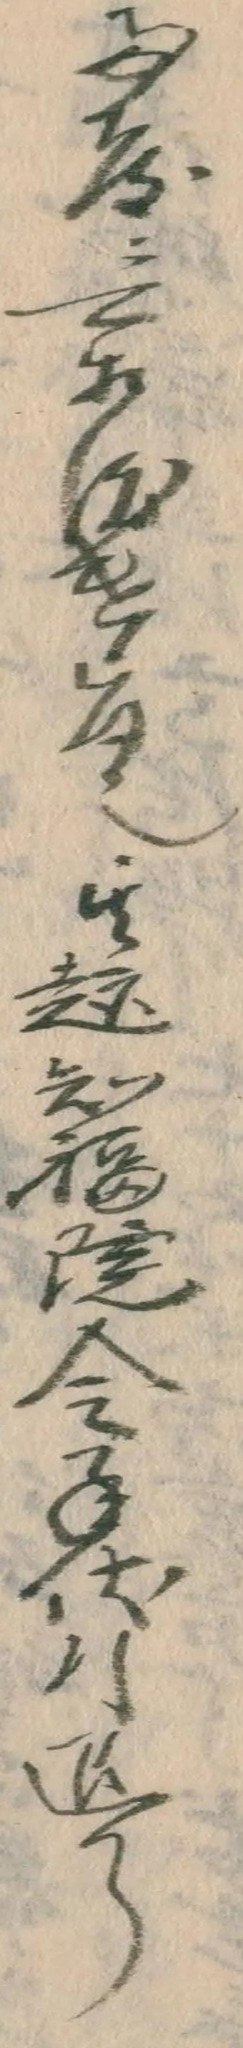両度ニ可相渡遣旨也其趣知福院令承伏引退了
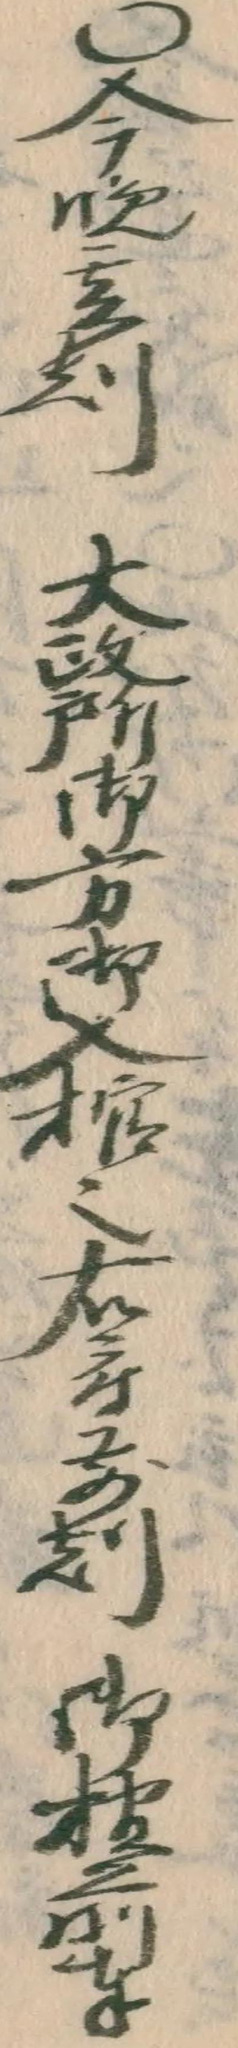○今晩亥刻大政所御方御入棺也右ニ付前刻御棺前奉
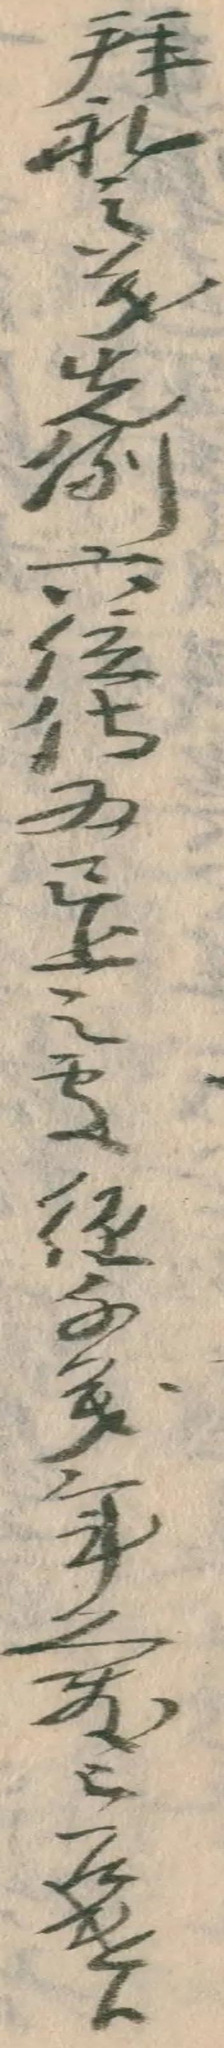拝礼之義先例六位侍為已上之處経千多年久敷被召遣候
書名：賀茂社記録. 第69冊
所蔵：国立国会図書館 National Diet Library, JAPAN
